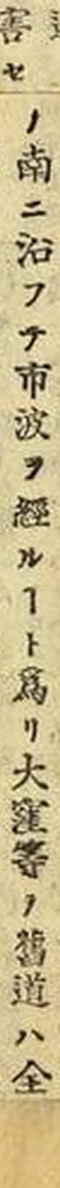ノ南ニ沿フテ市波ヲ經ルヿト爲リ大窪等ノ舊道ハ全
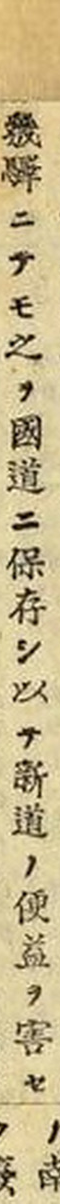幾驛ニテモ之ヲ國道ニ保存シ以テ新道ノ便益ヲ害セ
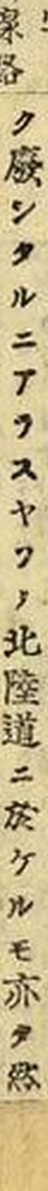ク廢シタルニアラスヤソノ北陸道ニ於ケルモ亦タ然
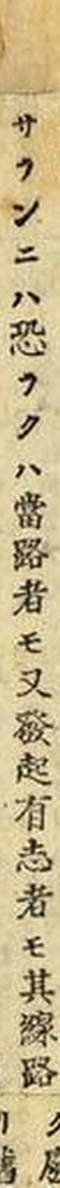サランニハ恐ラクハ當路者モ又發起有志者モ其線路
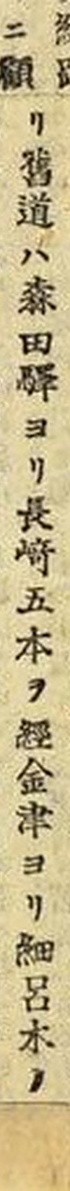リ舊道ハ森田驛ヨリ長崎五本ヲ經金津ヨリ細呂木ノ
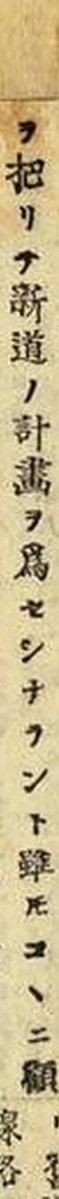ヲ把リテ新道ノ計畫ヲ爲セシナラント雖𪜈コヽニ顧
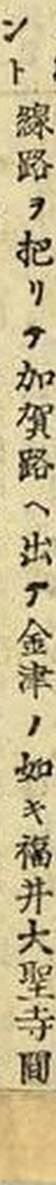線路ヲ把リテ加賀路へ出テ金津ノ如キ福井大聖寺間
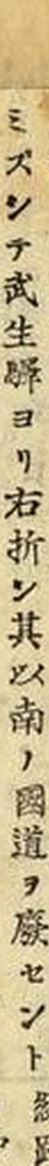ミズシテ武生驛ヨリ右折シ其以南ノ國道ヲ廢セント
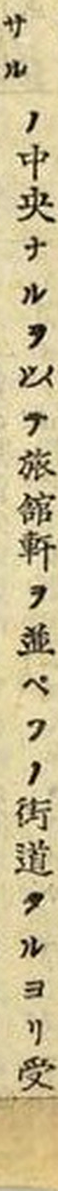ノ中央ナルヲ以テ旅館軒ヲ並ベソノ街道タルヨリ受
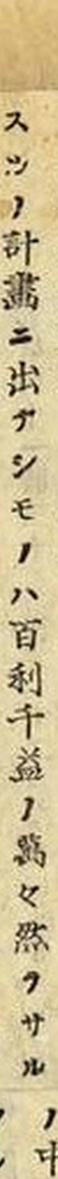スルノ計畫ニ出ナシモノハ百利千益ノ萬々然ラサル
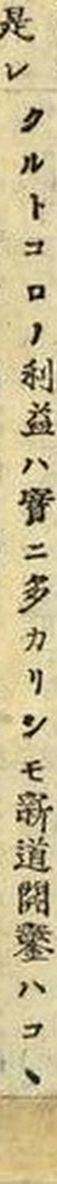クルトコロノ利益ハ實ニ多カリシモ新道開鑿ハコヽ
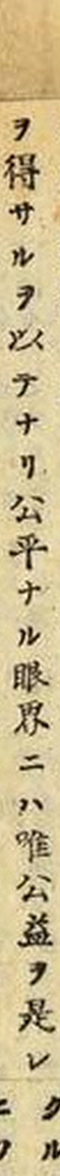ヲ得サルヲ以テナリ公平ナル眼界ニハ唯公益ヲ是レ
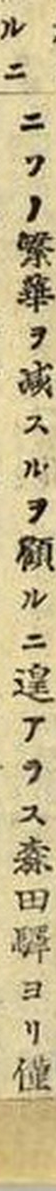ニソノ繁華ヲ減スルヲ顧ルニ遑アラス森田驛ヨリ僅
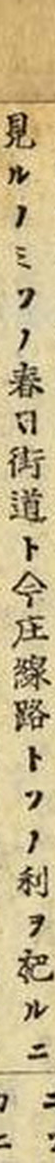見ルノミソノ春日街道ト今庄線路トソノ利ヲ把ルニ
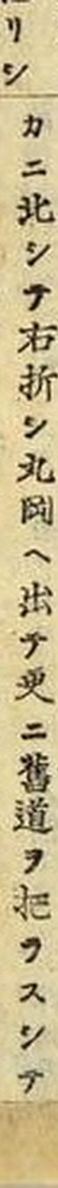カニ北シテ右折シ丸岡へ出テ更ニ舊道ヲ把ラスシテ
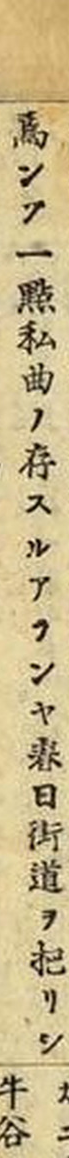焉ンゾ一點私曲ノ存スルアランヤ春日街道ヲ把リシ
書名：温古集 五巻
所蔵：福井県文書館 Fukui Prefectural Archives
